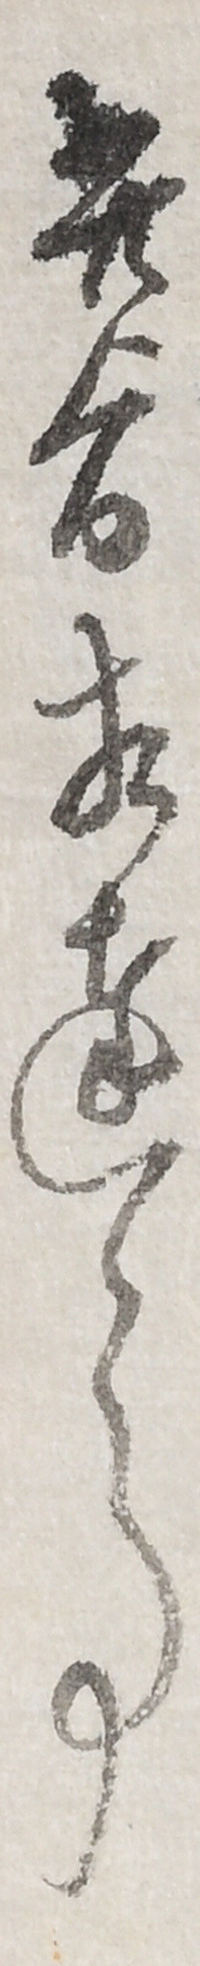此旨相達候事
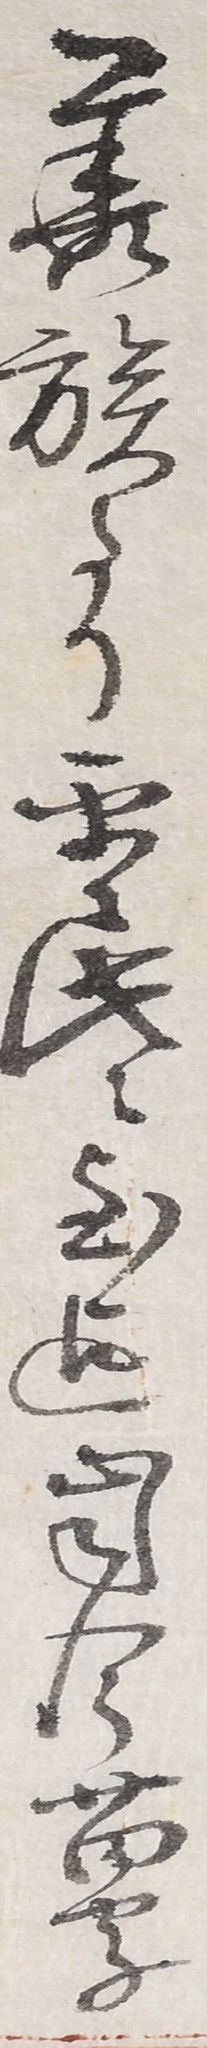華族より平民ニ至迄自今苗字
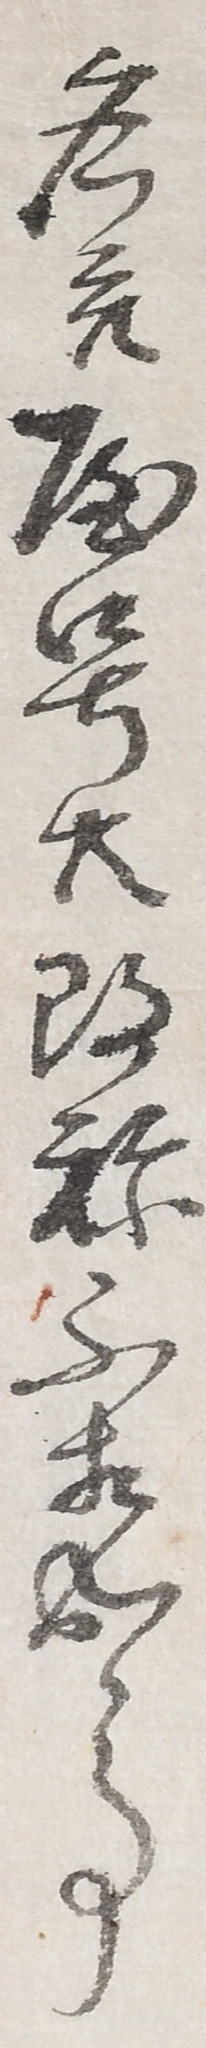名幷屋号共改称不相成候事
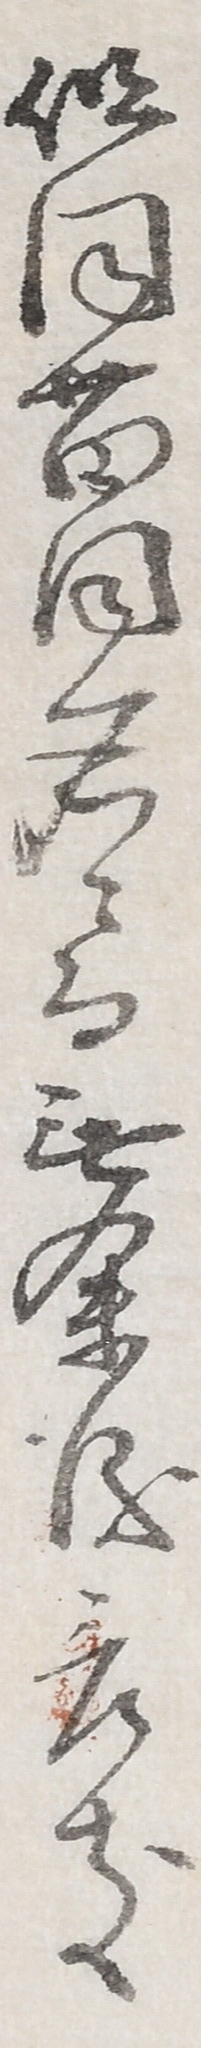但同苗同名ニ而無余儀差支
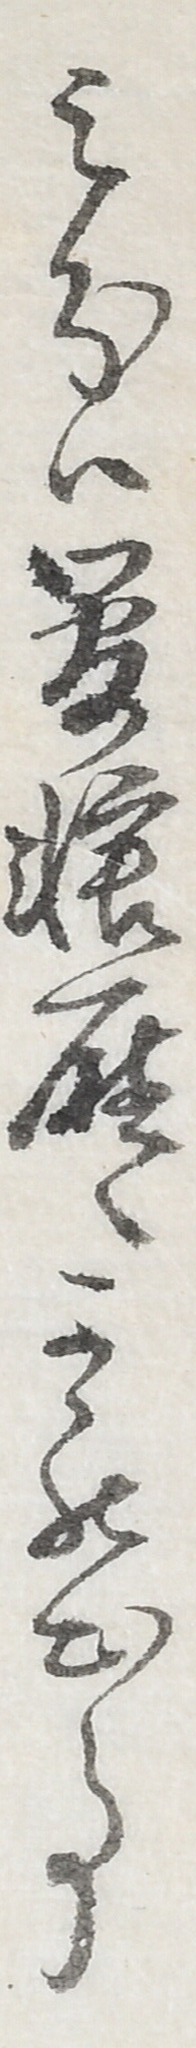之分ハ管轄庁へ可罷出事
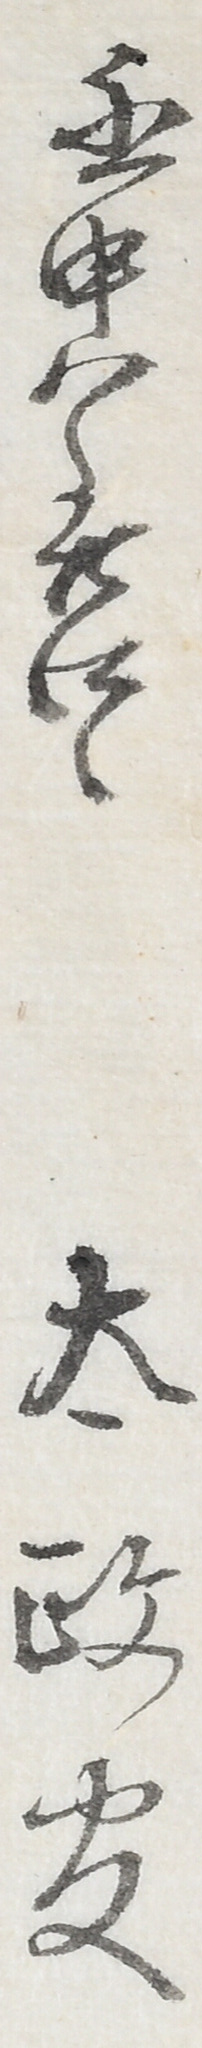壬申八月廿四日太政官
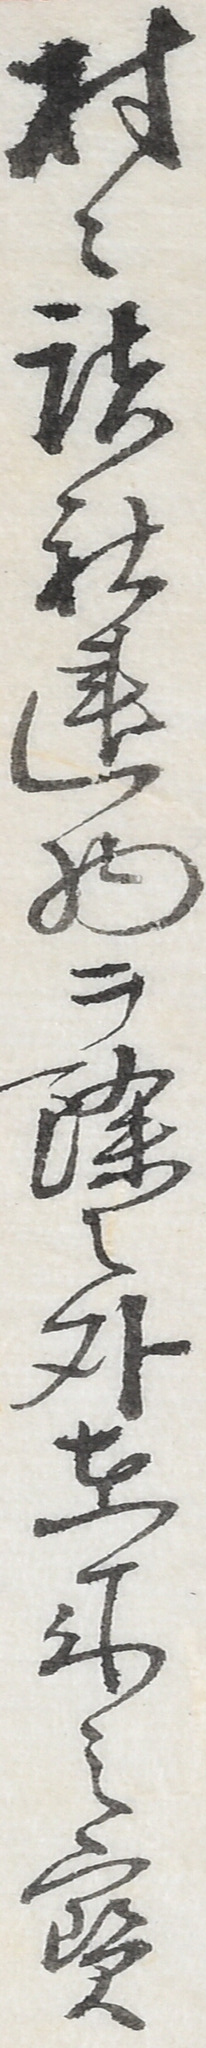村々諸社建物ヲ除之外在来之宝
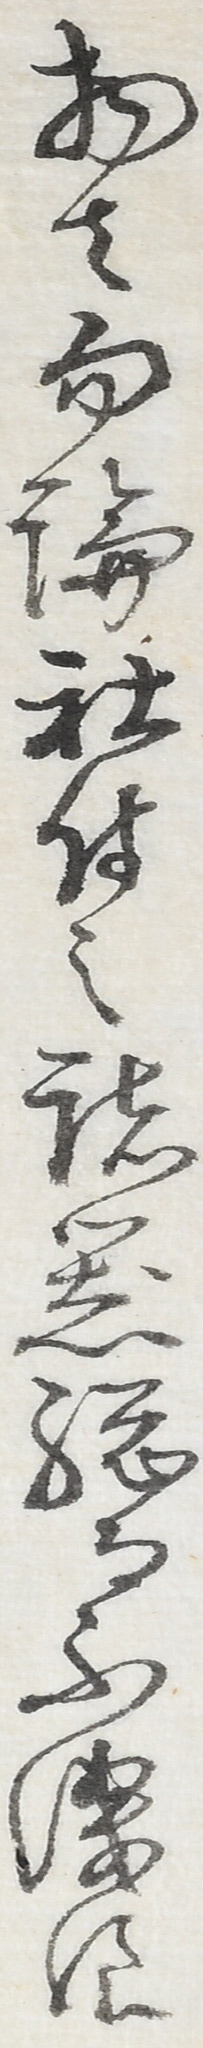物は勿論社付之諸器総而不洩様
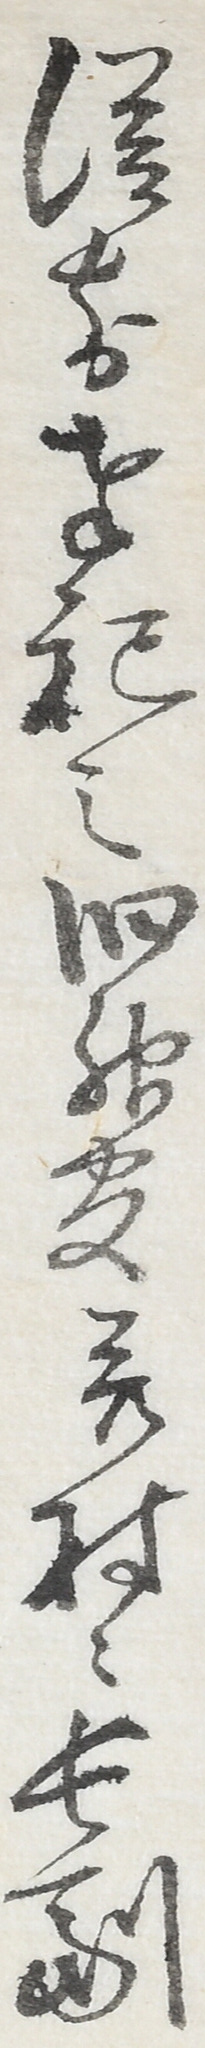従前奉祀之旧神官幷村々長副
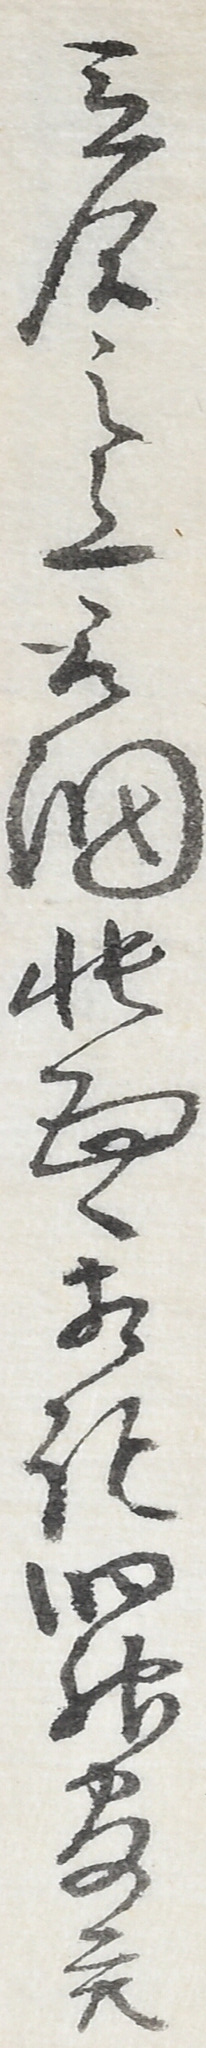立合之上取調帳面へ相記旧神官幷
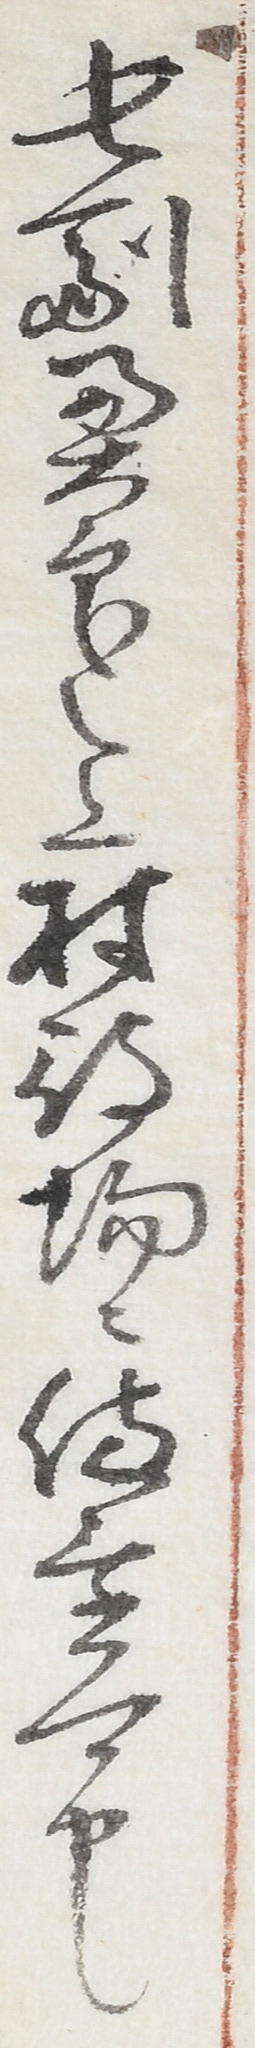長副奥印之上村役場ニ備置可申候
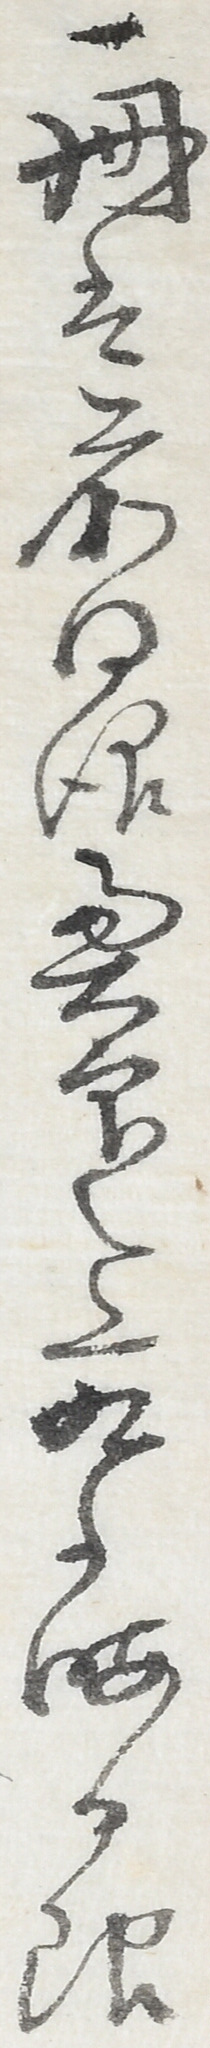一冊は前同様奥印之上九月晦日限

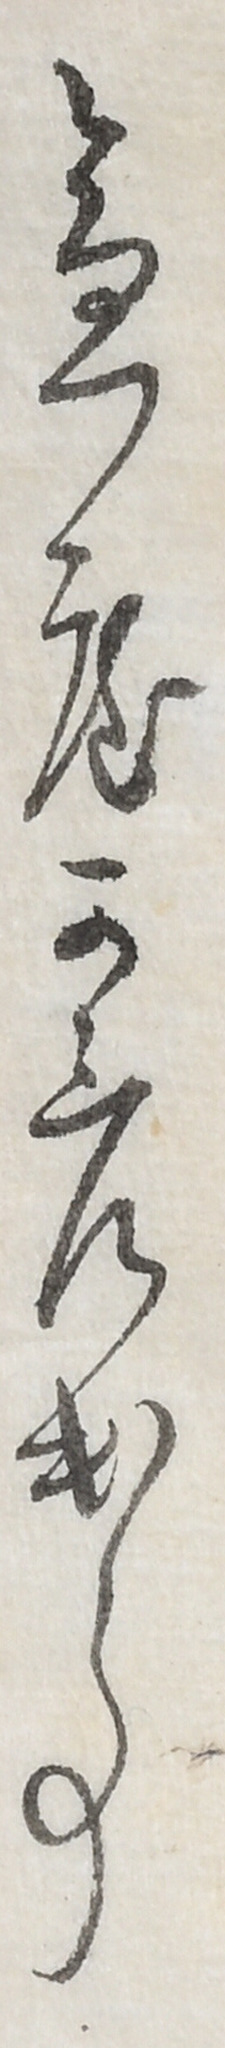急度可差出事
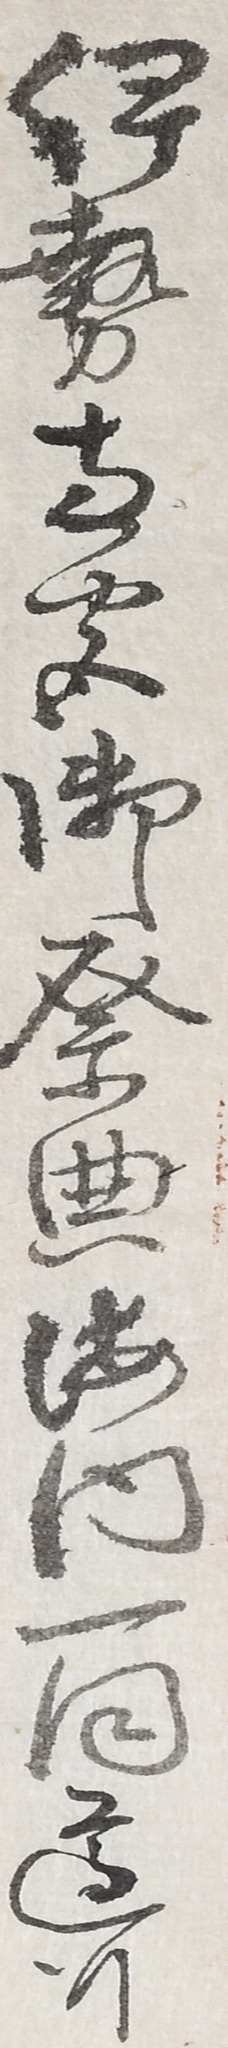伊勢雨宮御祭典海内一同道行
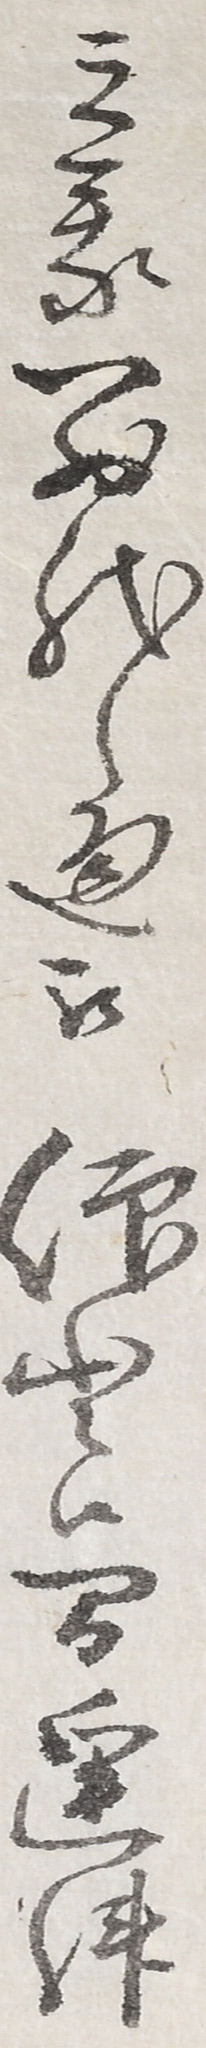之義別紙之通被仰出候間遥拝
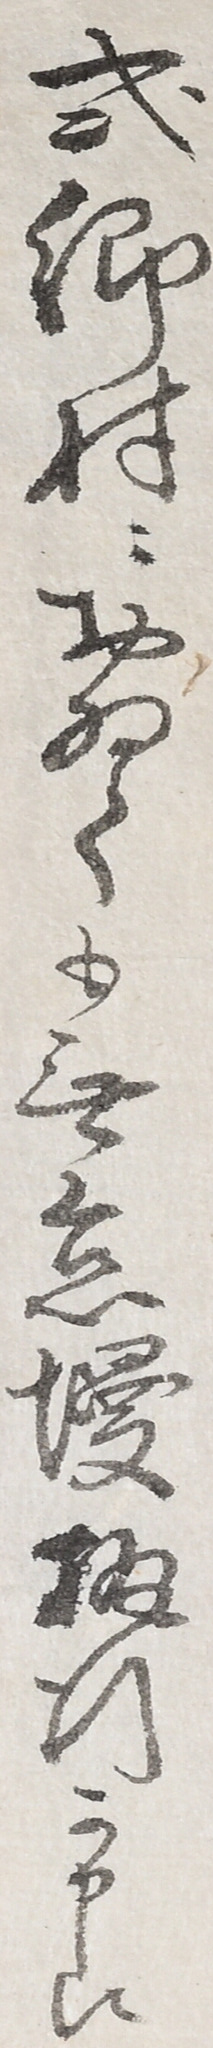式郷村ニおゐても無怠慢執行可申候
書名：壹番・御布告一式
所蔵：伊那市立高遠町図書館・合同会社AMANE
